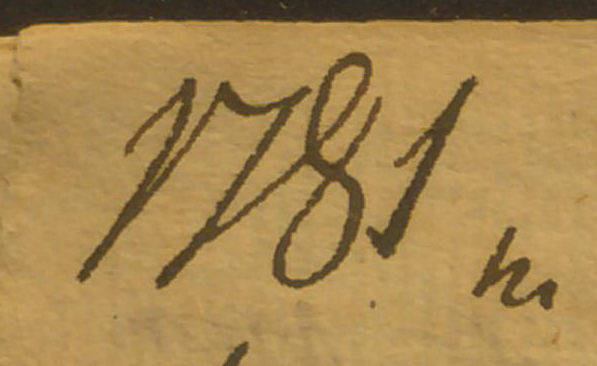1781
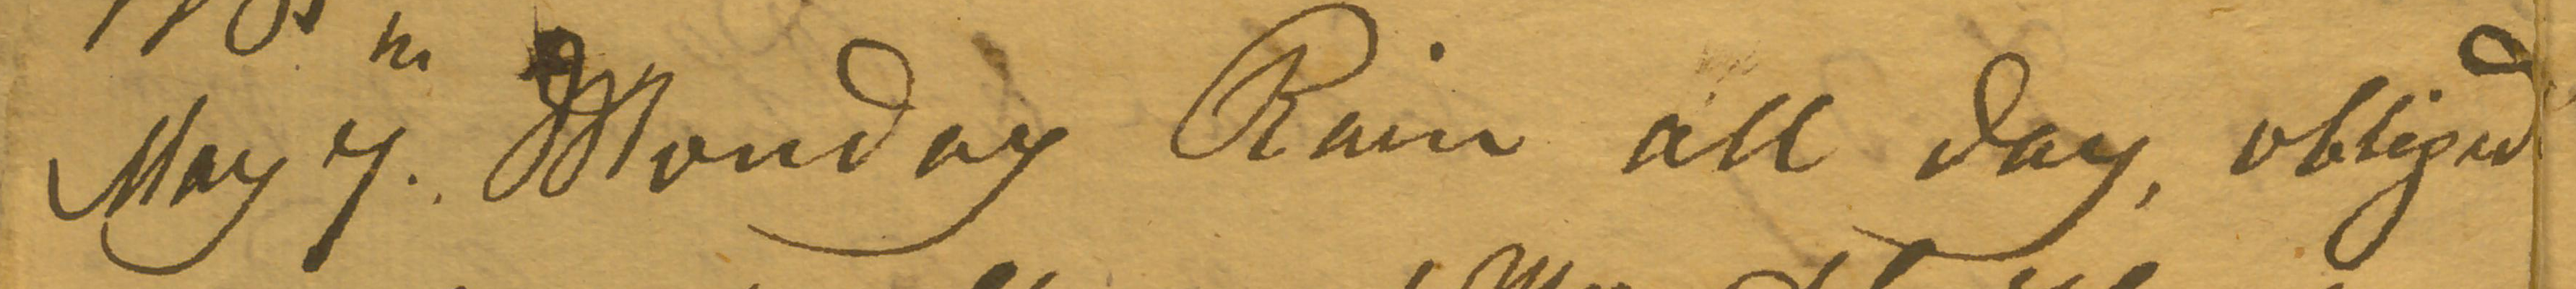May 7^th. Monday Rain all day obliged
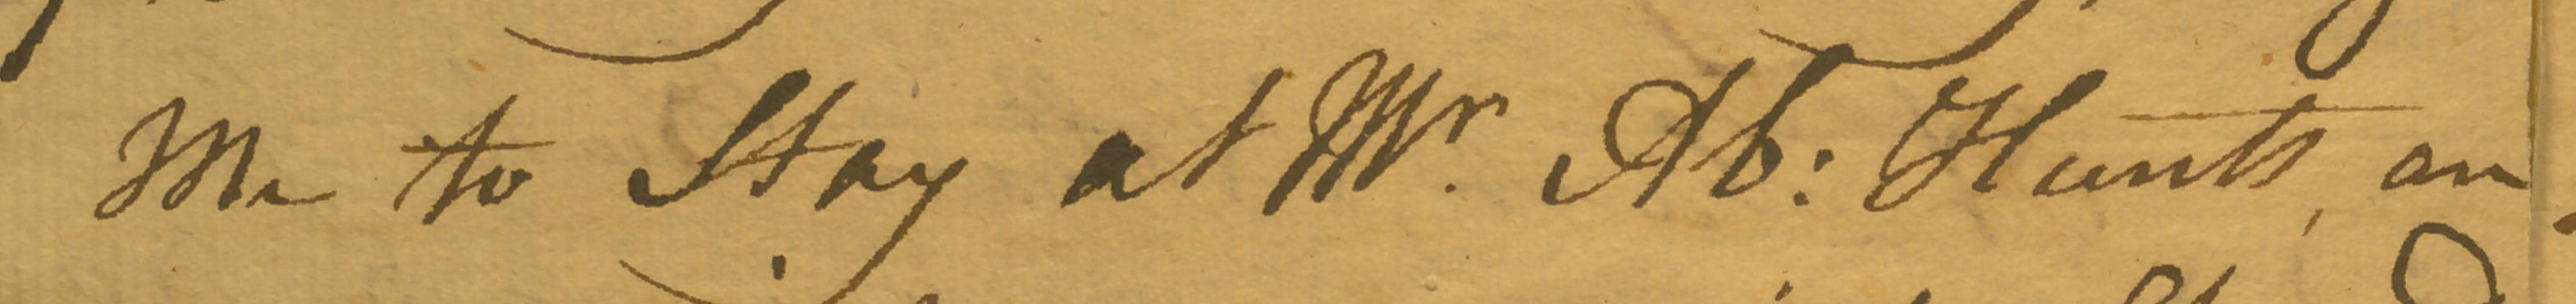Me to Stay at M^r. Ab. Hunts an
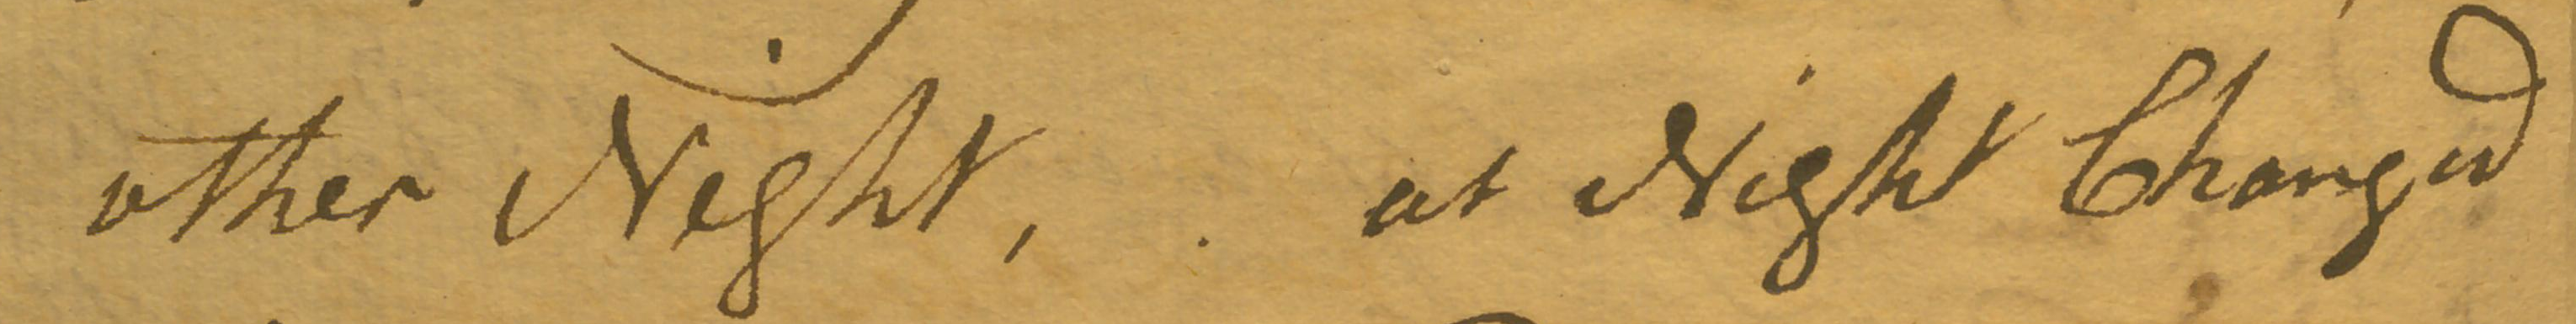other Night, at Night Changed
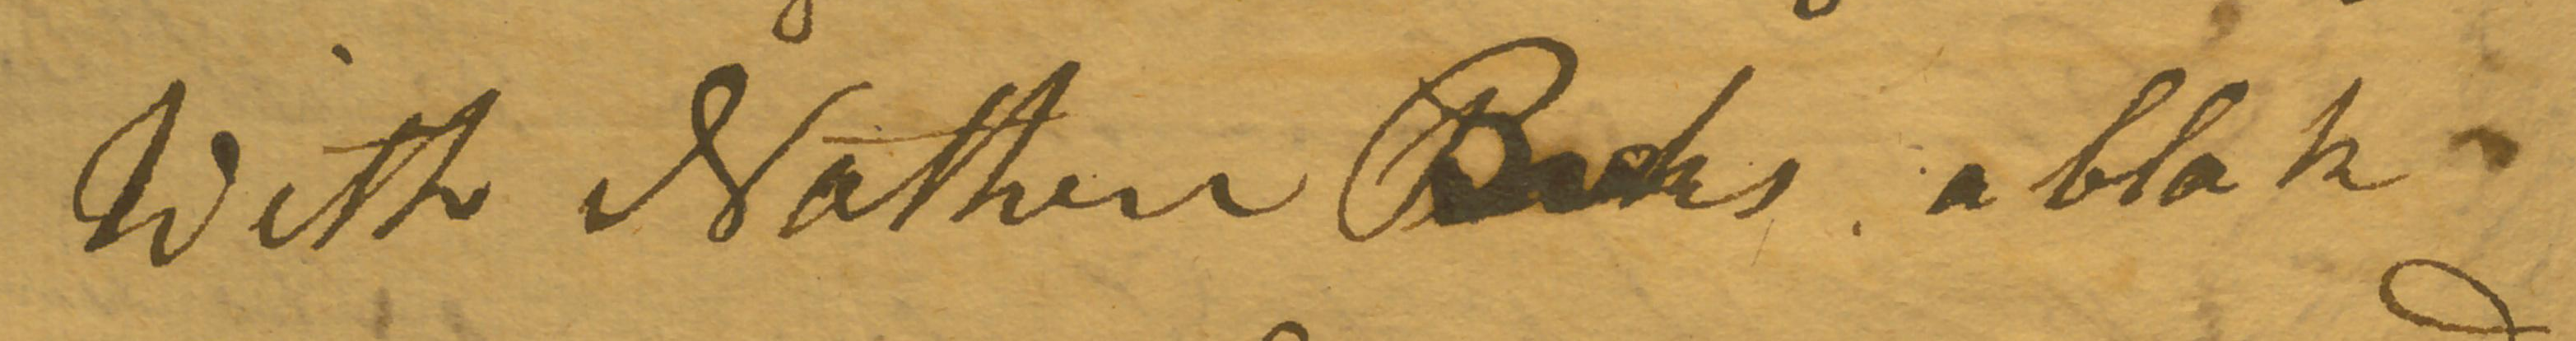With Nathen Reeks a blak
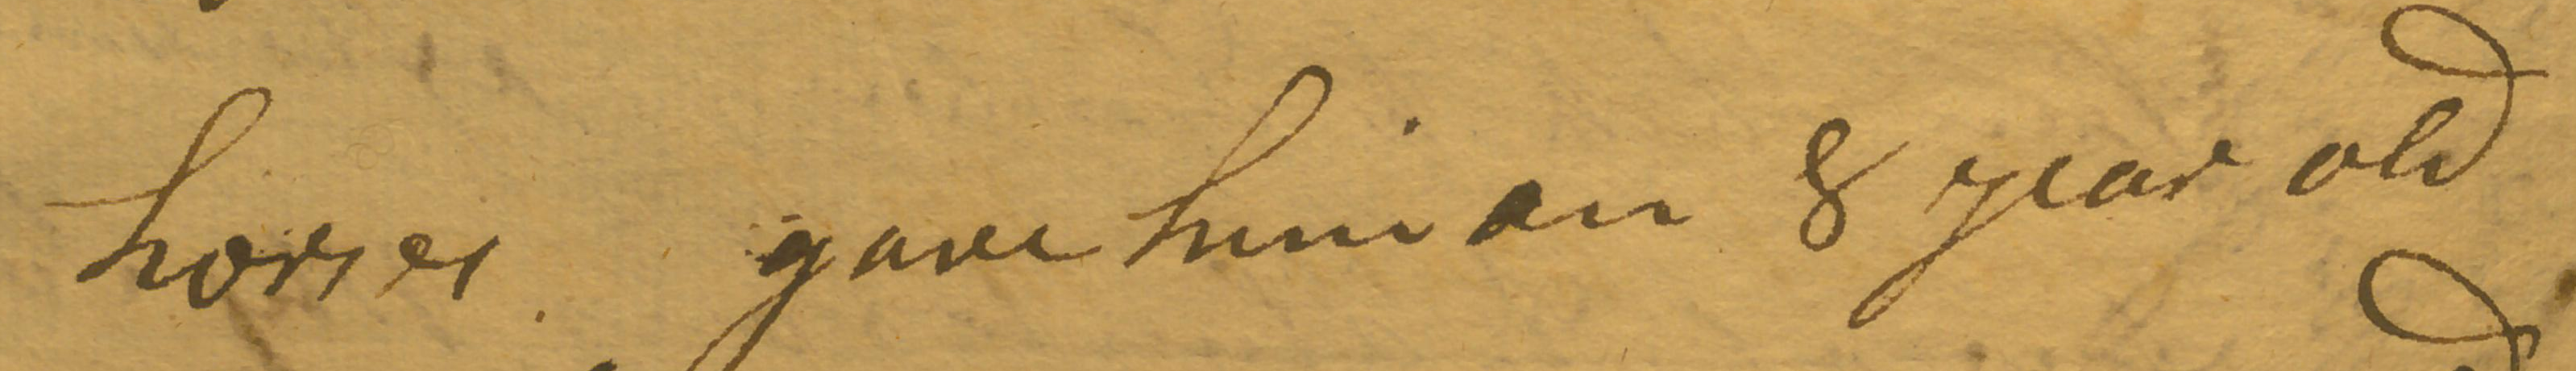hores gave him an 8 year old
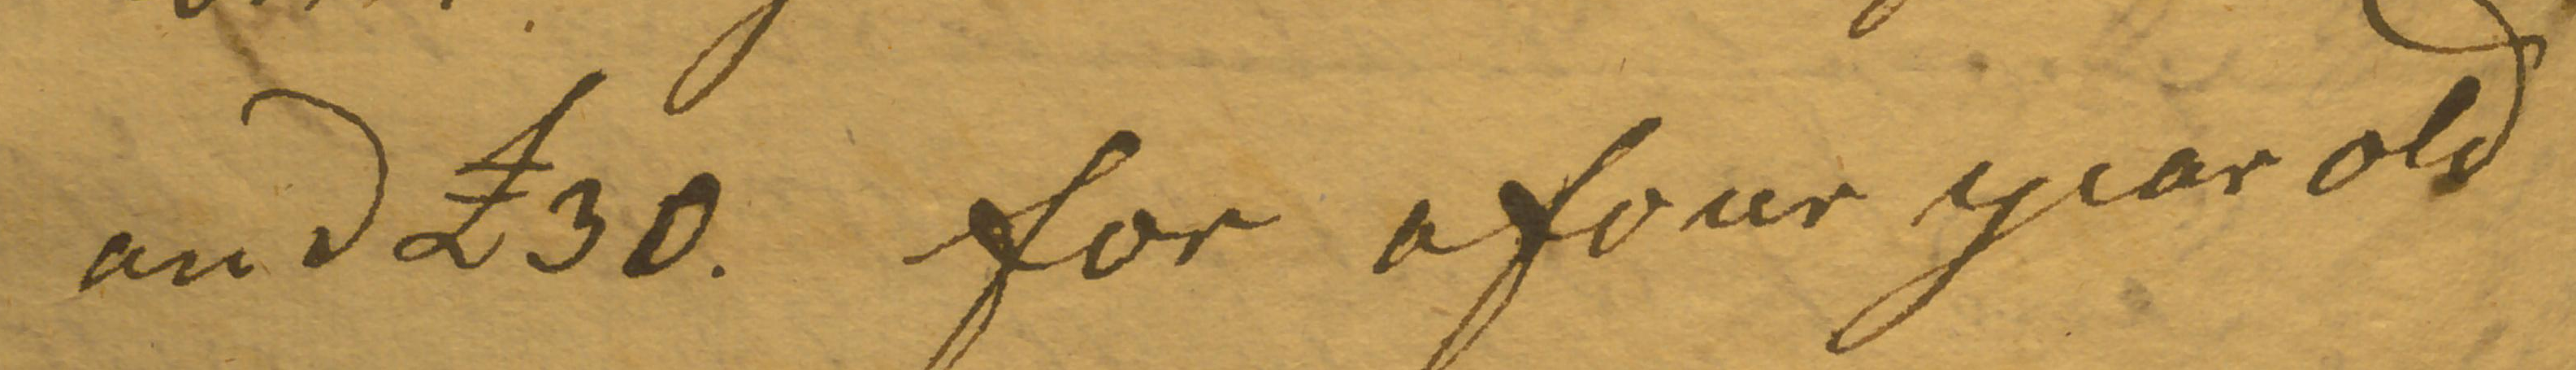and £30. for a four year old
